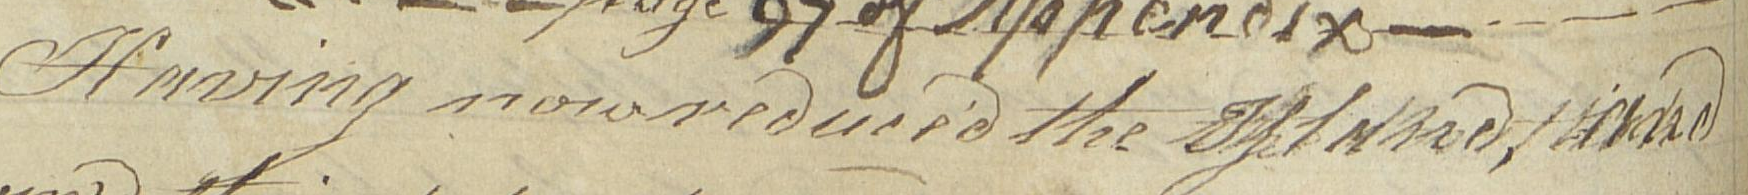Having now reduced the Island, and
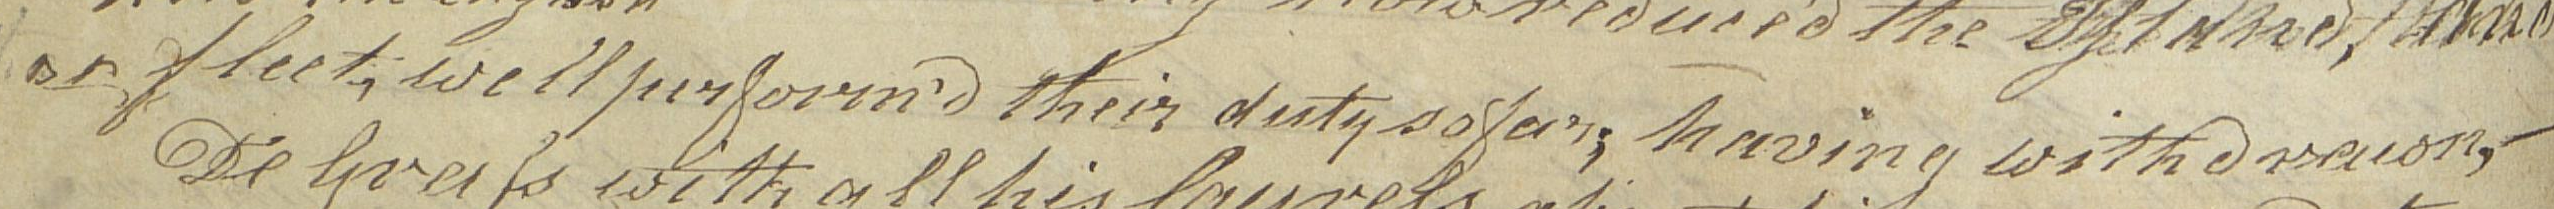or fleet, well perform'd their duty so far; having withdrawn,
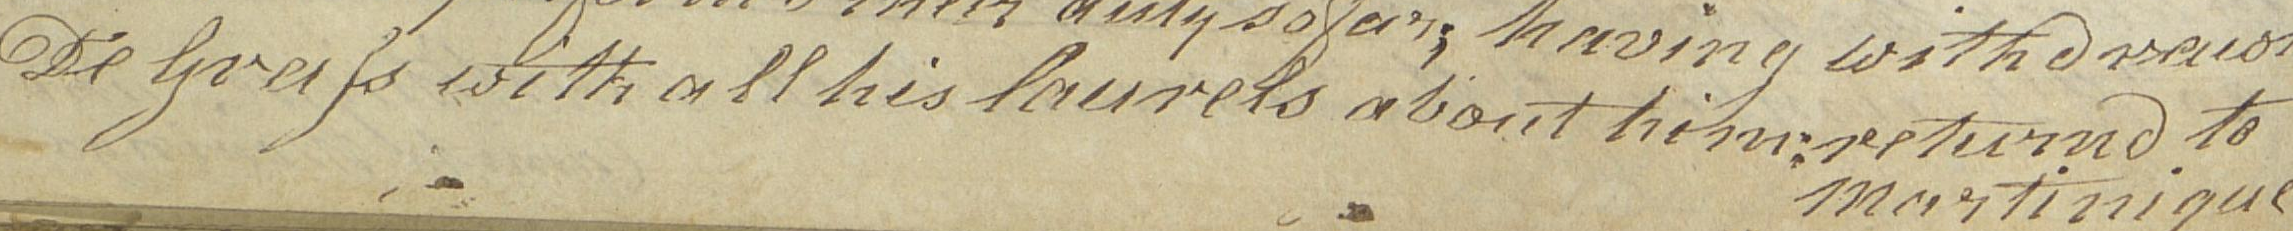De Grass with all his laurels about him: returnd to
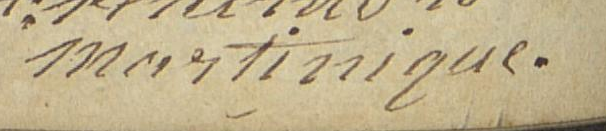Martinique.
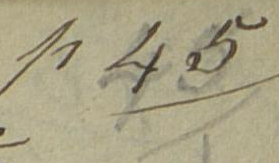p 45
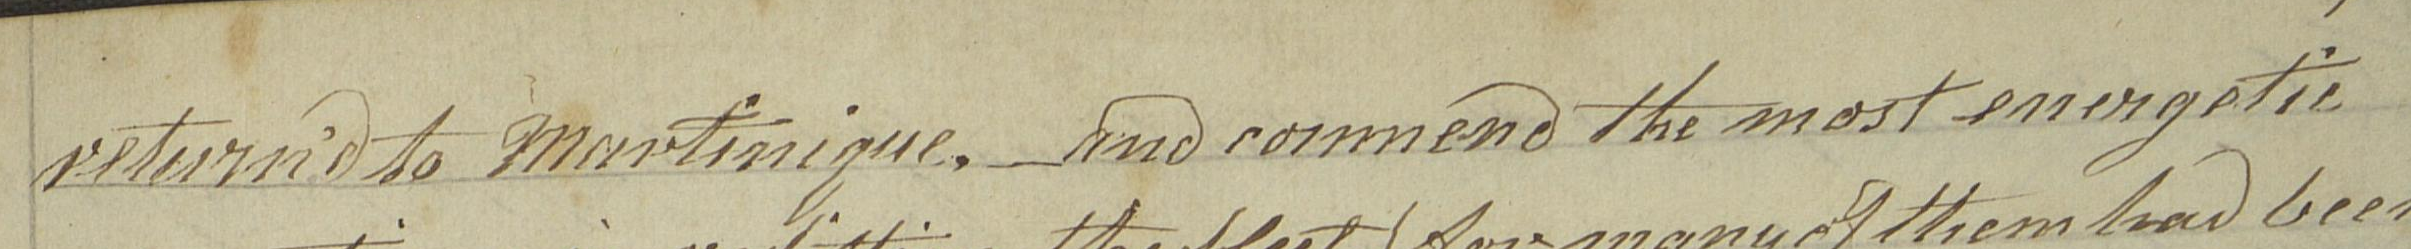returnd to Martinique, and commend the most energetic
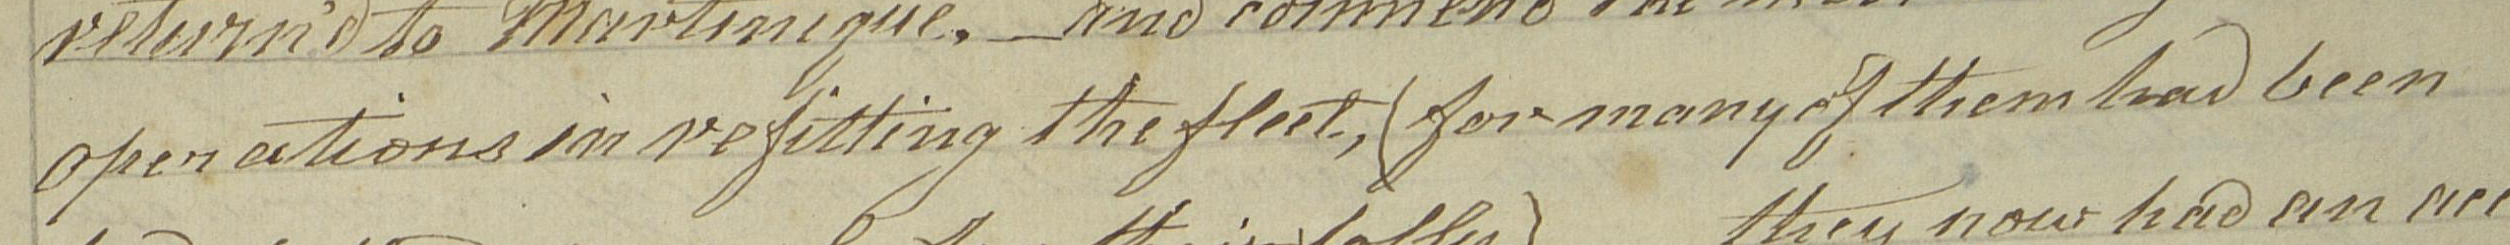operations in refitting the fleet, (for many of them had been
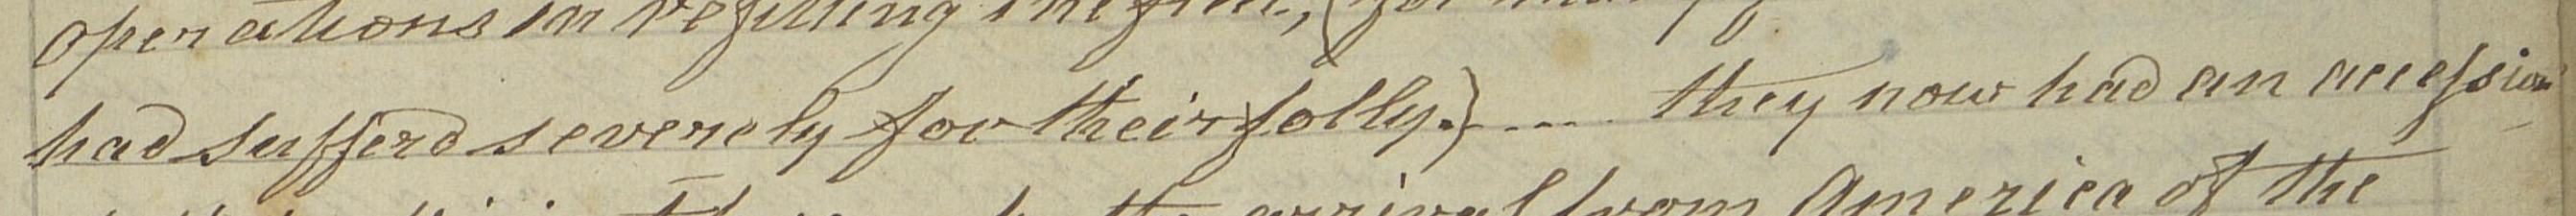had sufferd severely for their folly.) They now had an accession
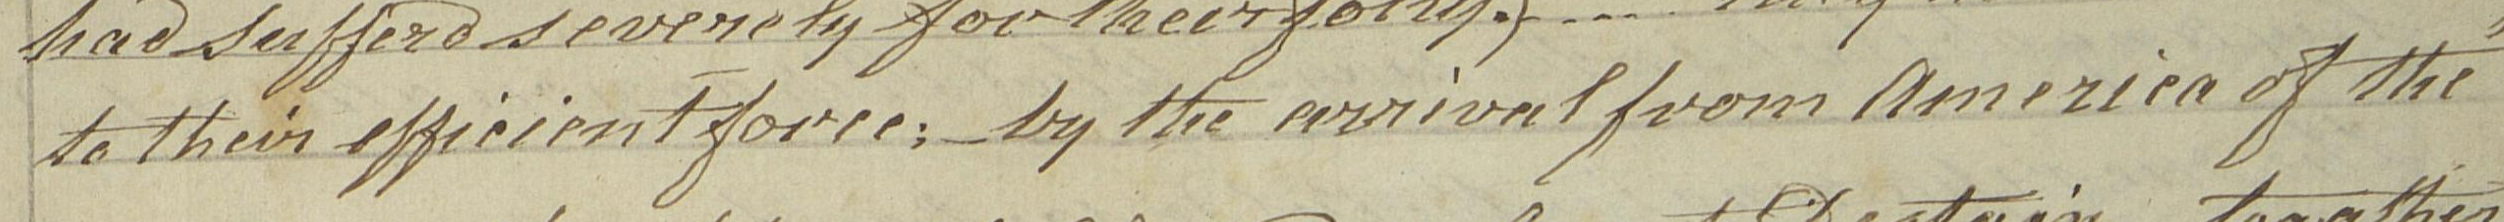to their efficient force; by the arrival from America of the
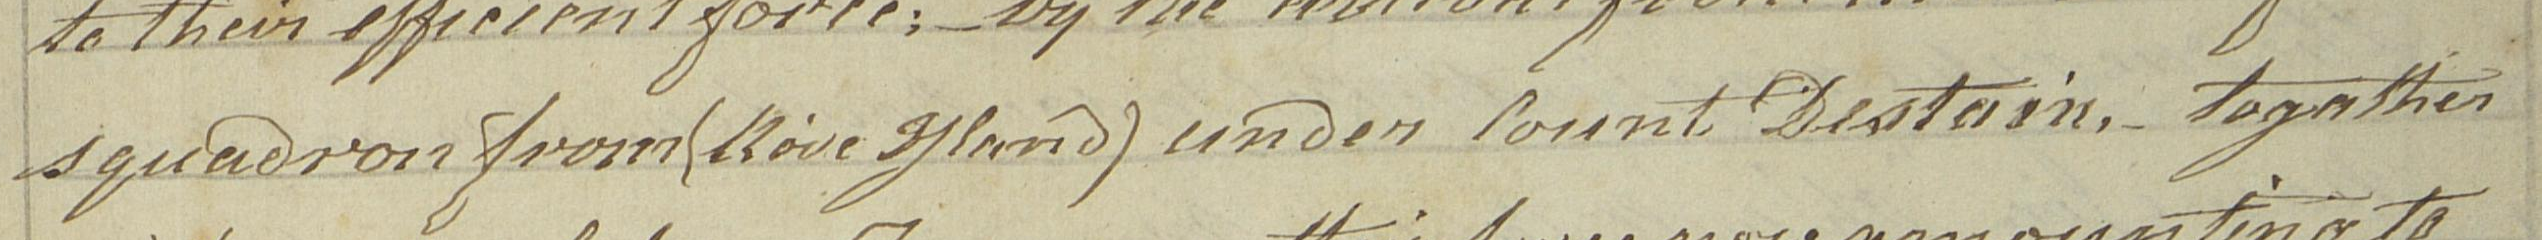squadron from (Rove Island) under Count Destain, together
